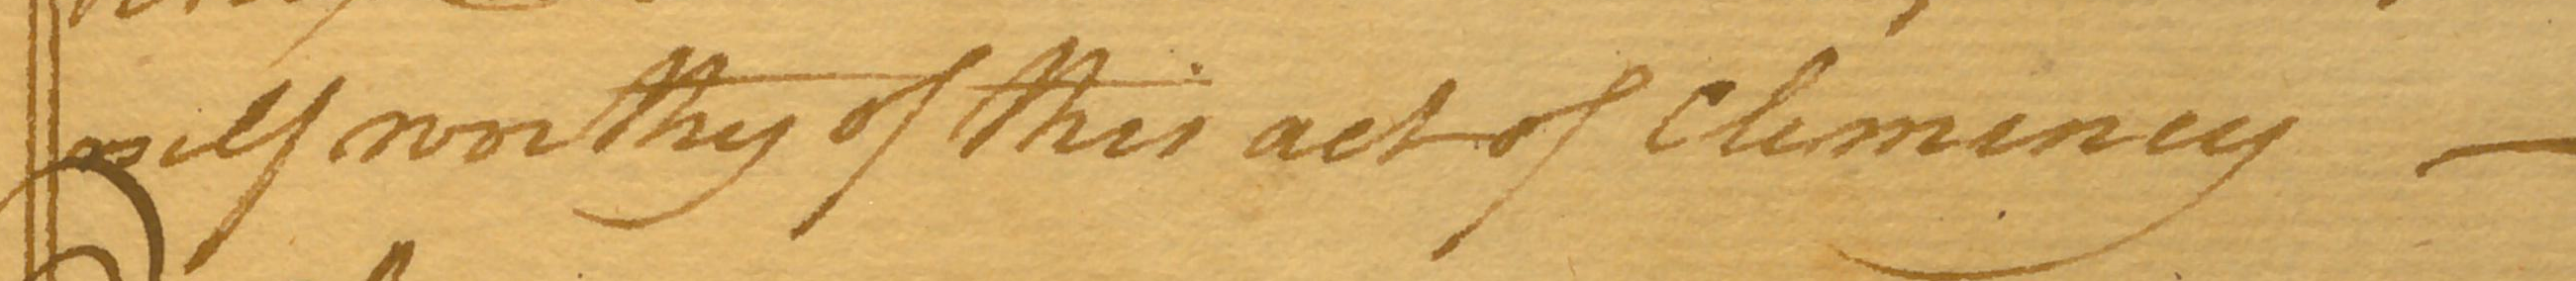self worthy of this act of clemency-
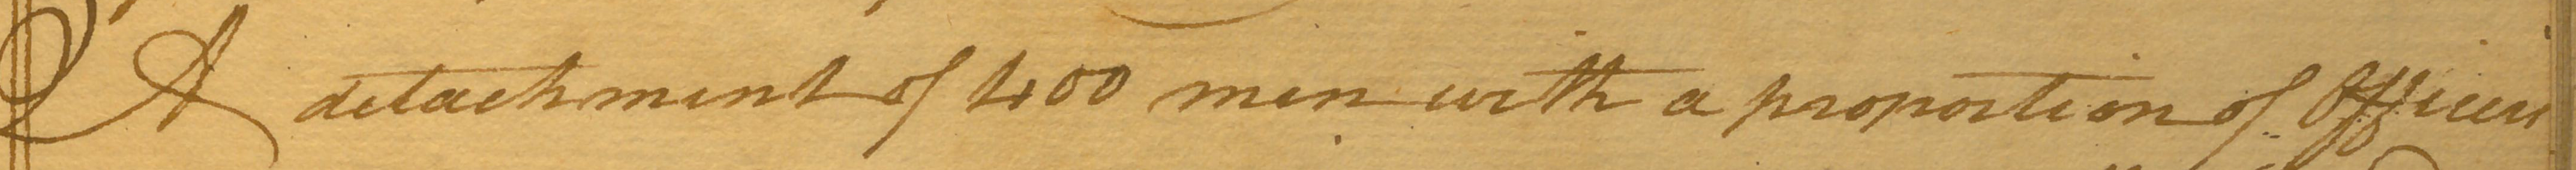A detachment of 400 men with a proportion of Officers
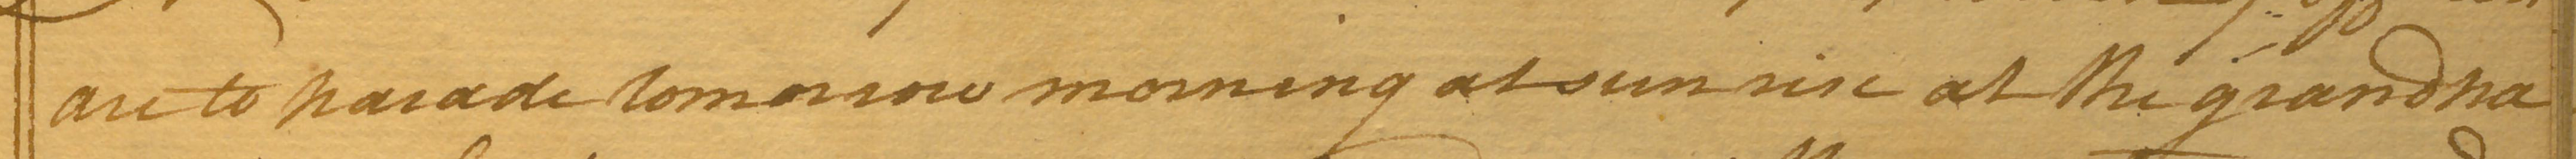are to parade tomorrow morning at sunrise at the grand pa
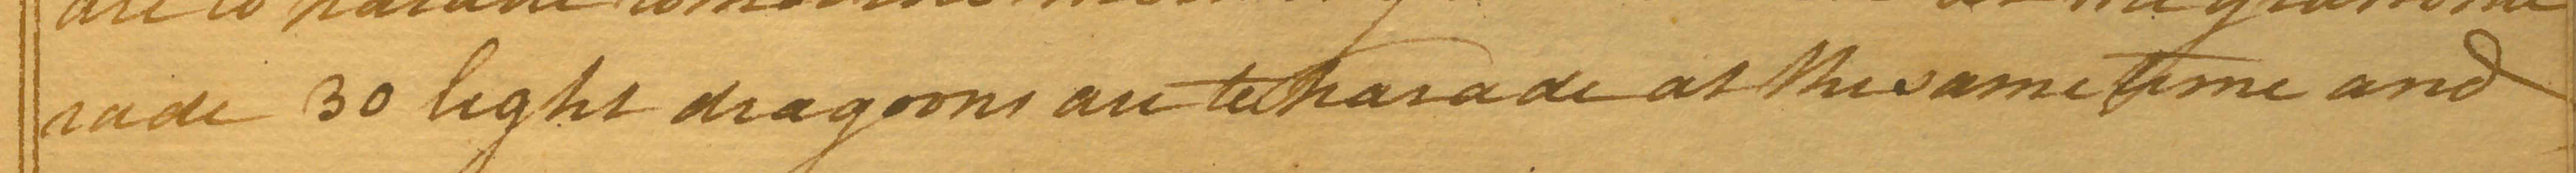rade 30 light dragoons are to parade at the same time and
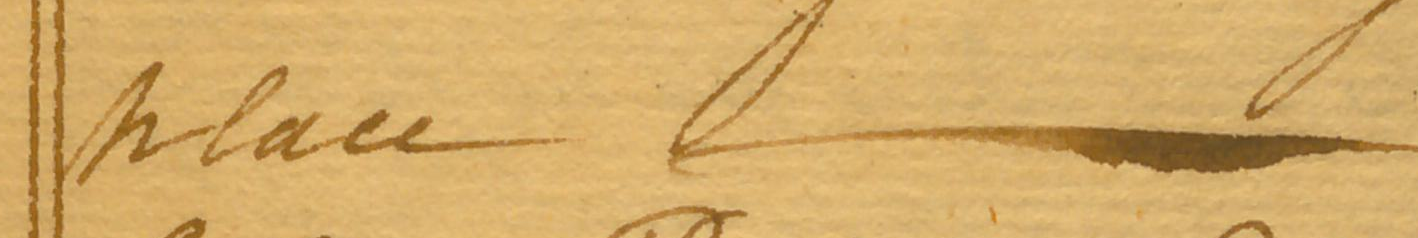place-
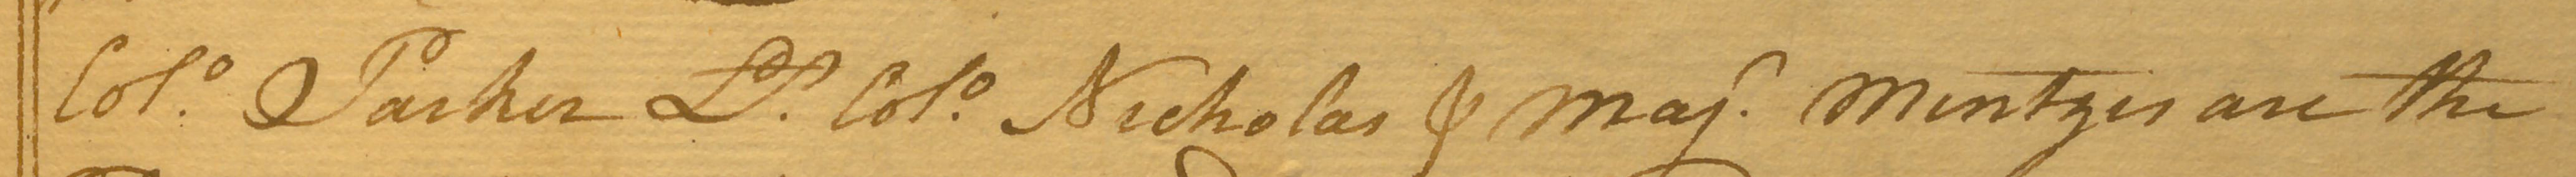Col^o. Parker L^t. Col^o. Nicholas & Maj^r. Mentzes are the
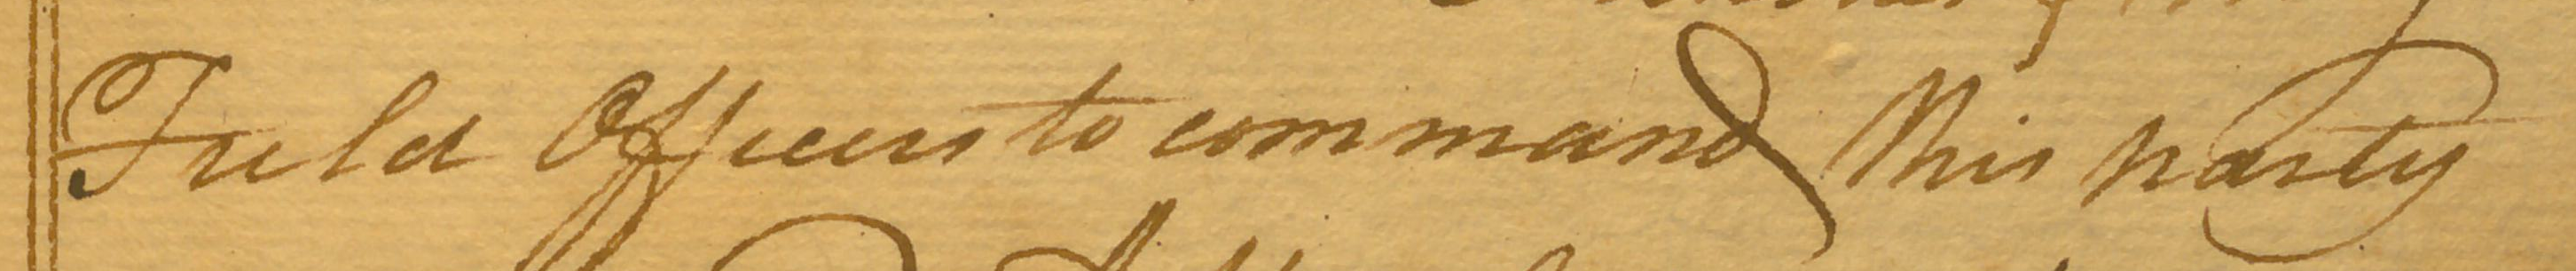Fild Officers to command this party
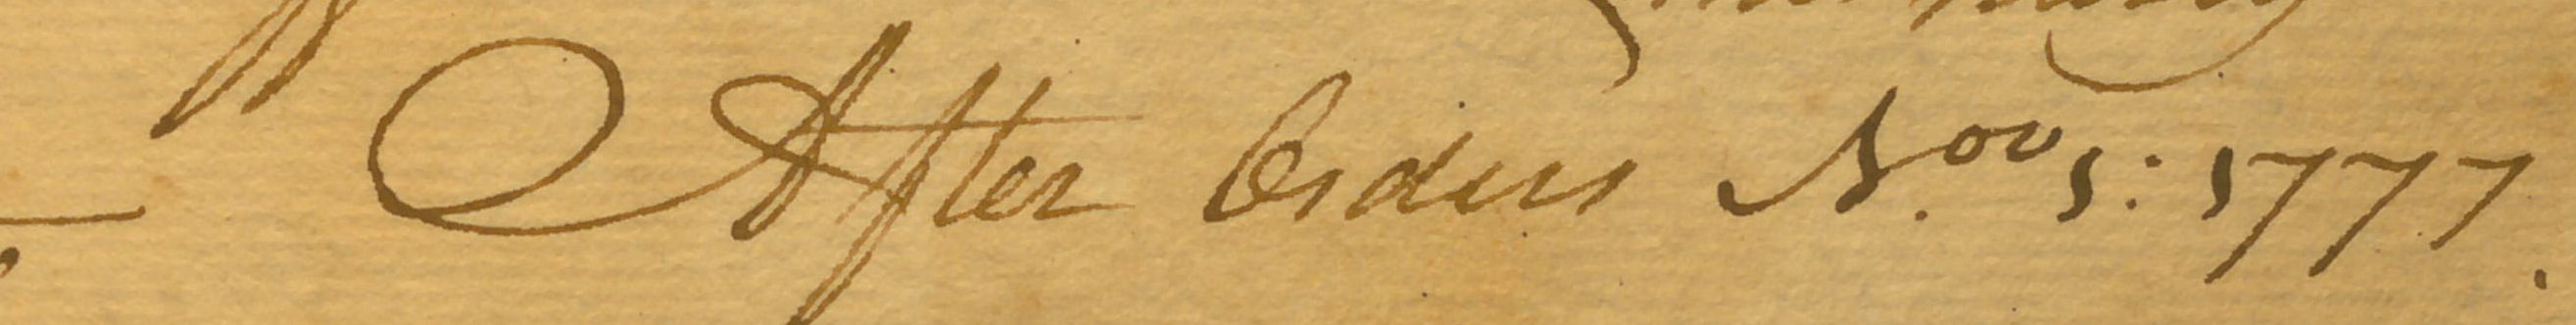After Orders N^ov. 5: 1777.
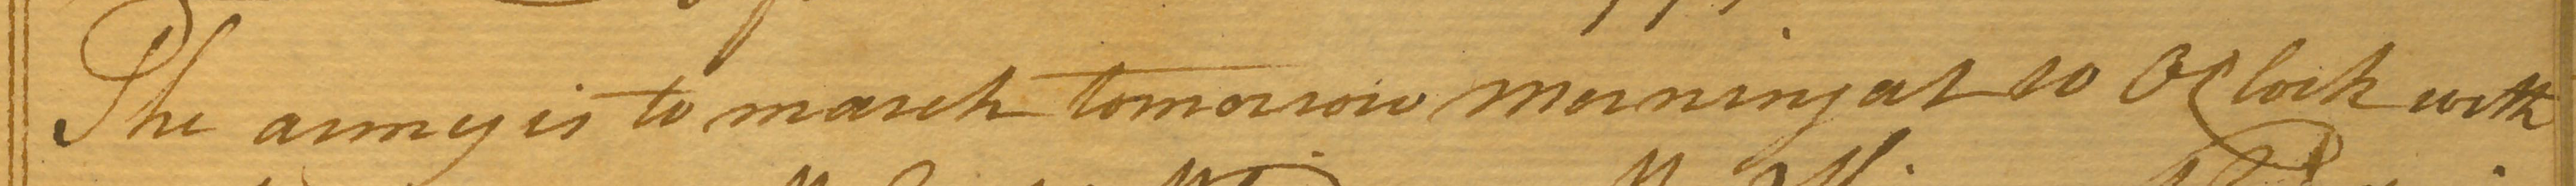The army is to march tomorrow morning at 10 OClock with
